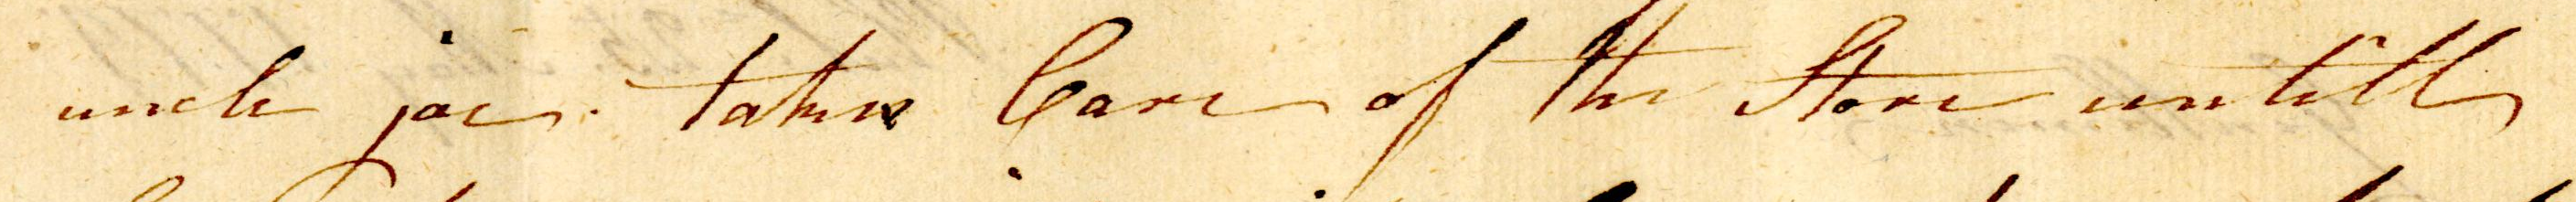uncle jac take care of the Store untill
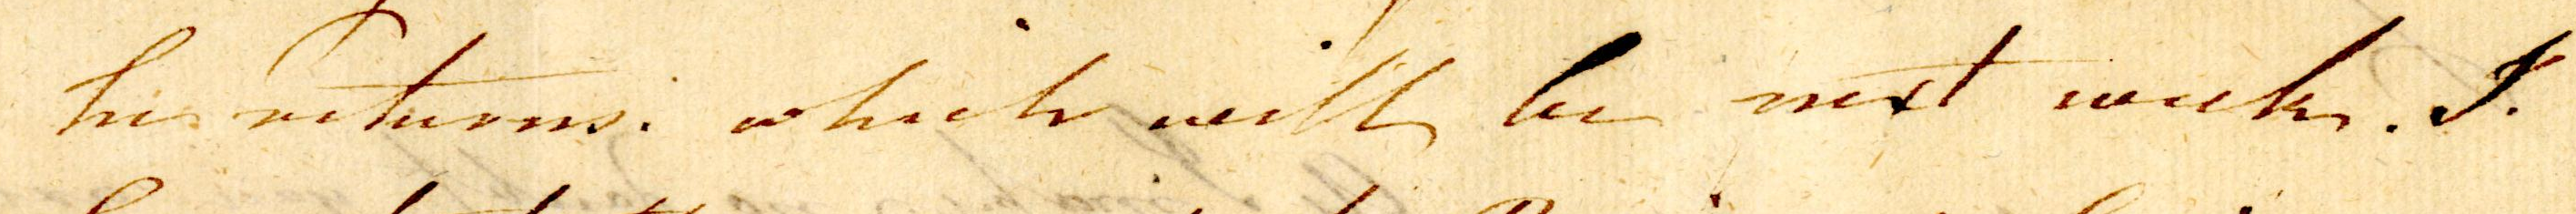her returns which will be next week. I
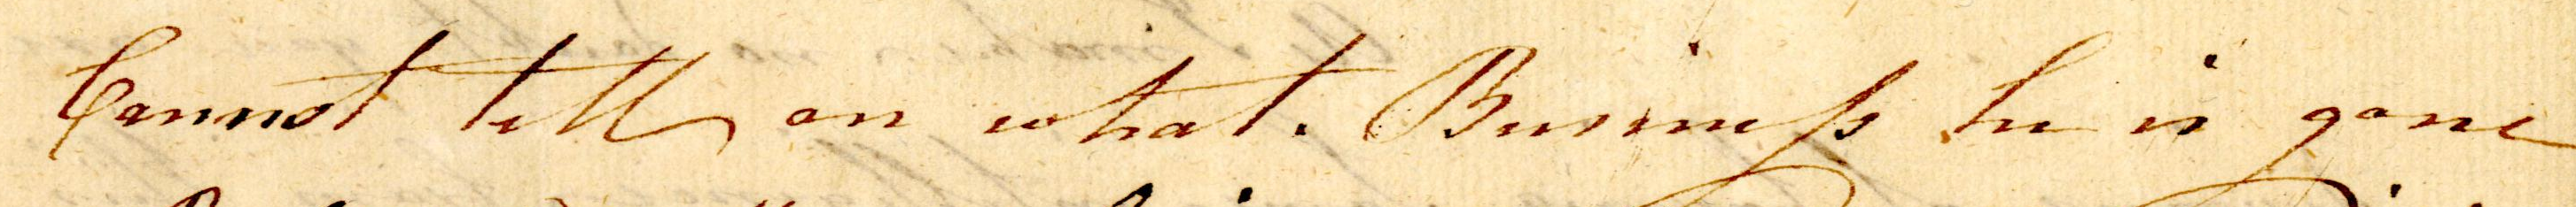Cannot tell on what Business he is gone
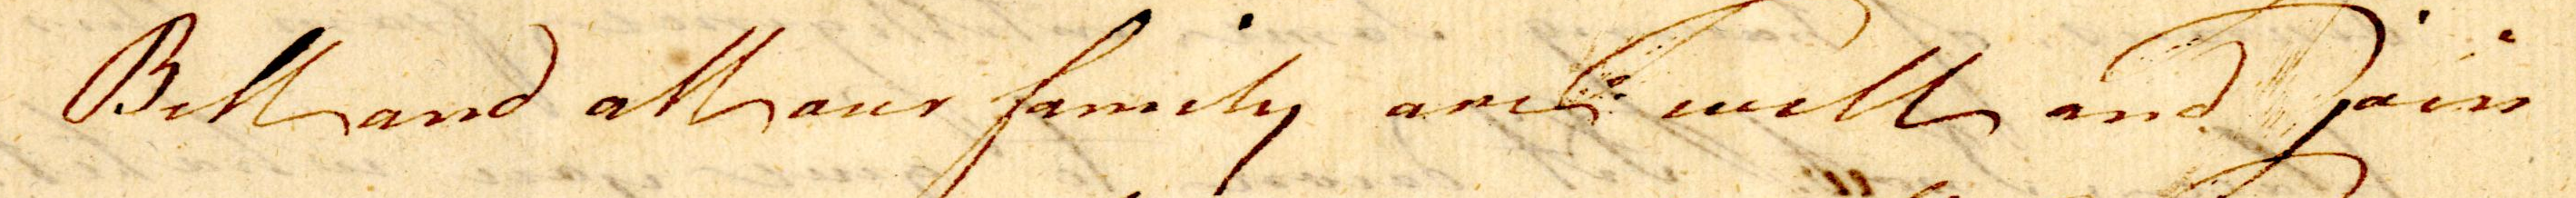Bell and all our family are well and joins
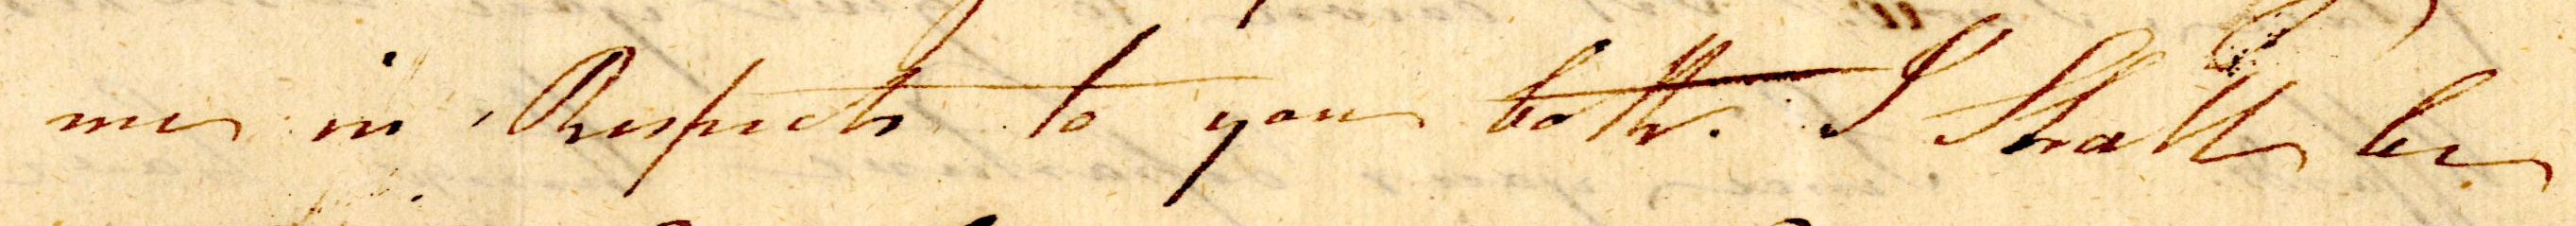me in Respects to you both. I Shall be
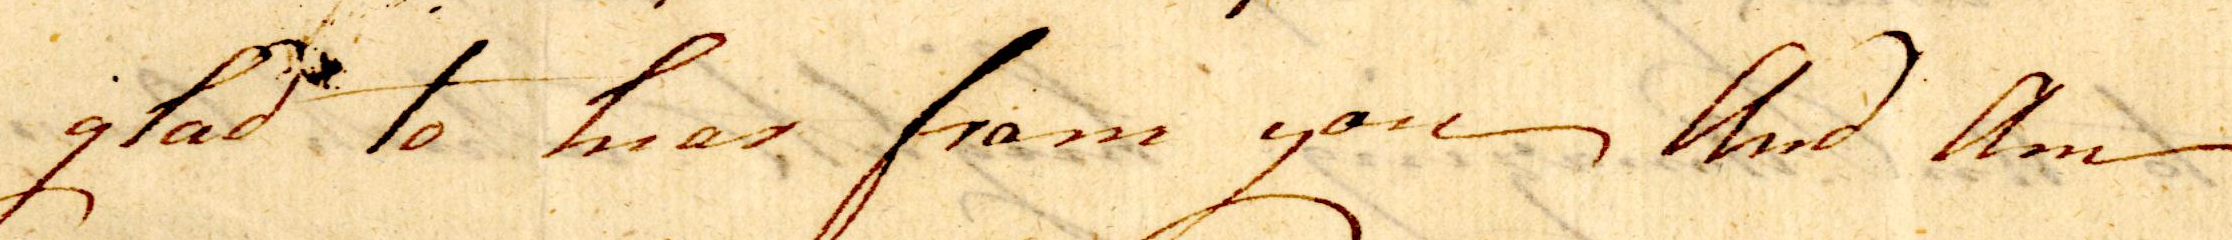glad to hear from you And Am
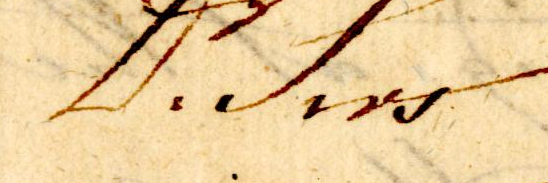D^r. Sirs
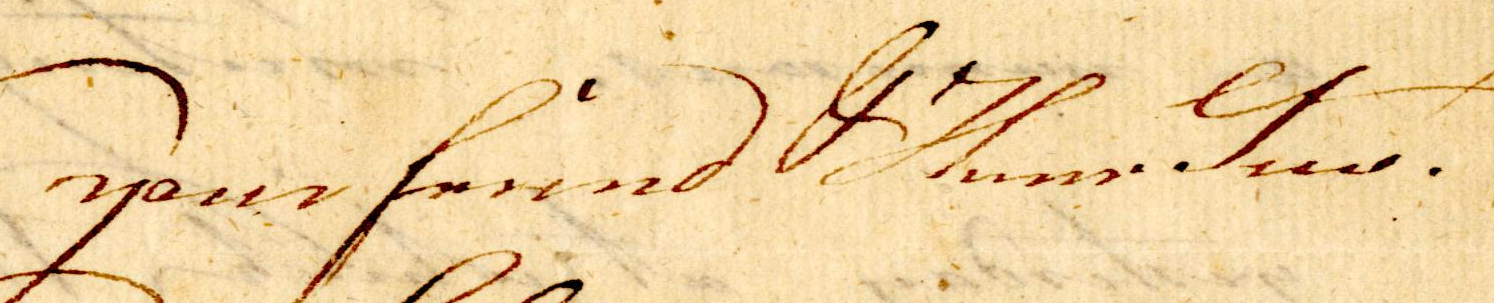your friend & Hum Serv^t.
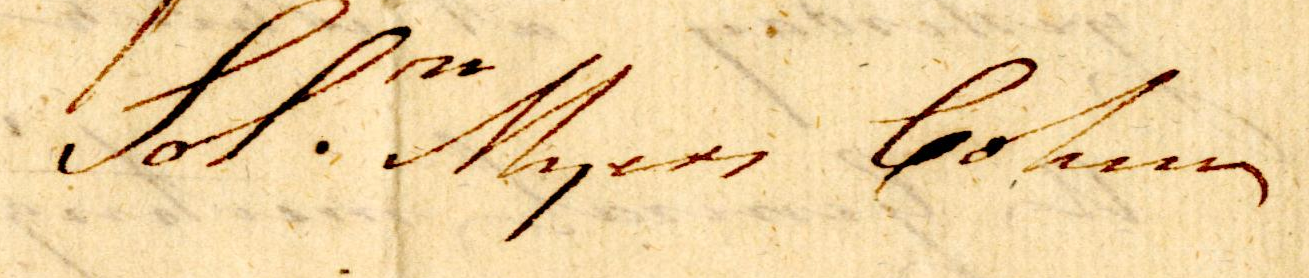Sol^m Myers Cohen
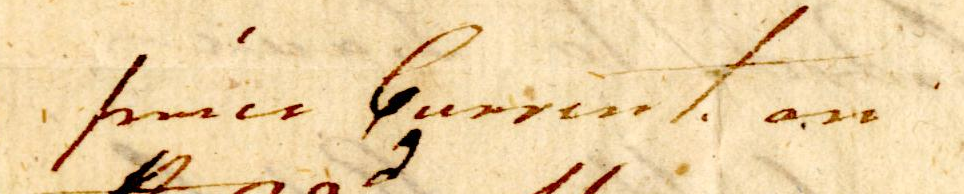prices Current on
